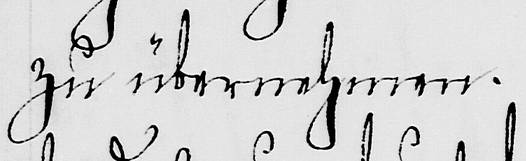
zu übernehmen.
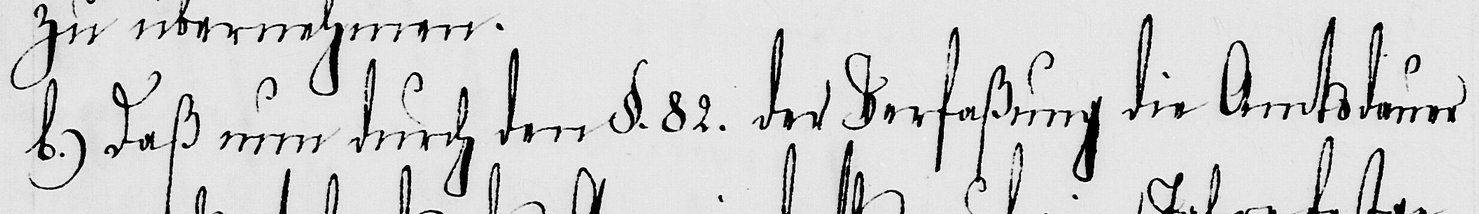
b.) Daß nun durch den §. 82. der Verfaßung die Amtsdauer
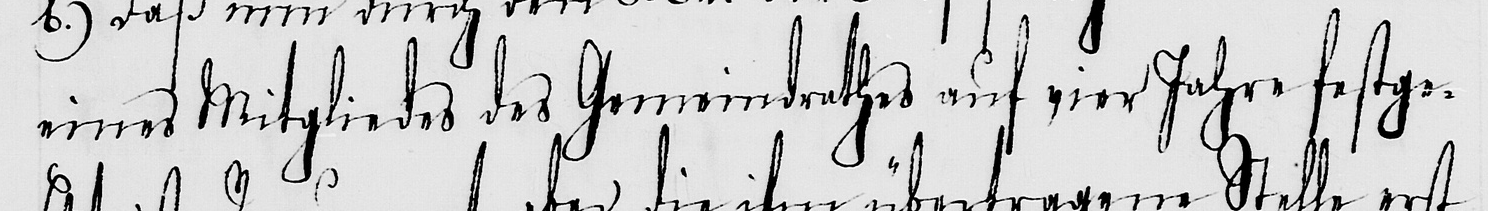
eines Mitgliedes des Gemeindrathes auf vier Jahre festg¬
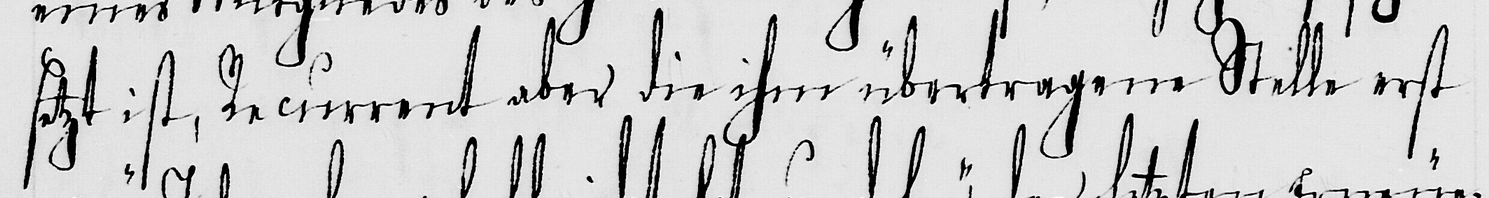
etzt ist, Recurrent aber die ihm übertragene Stelle erst
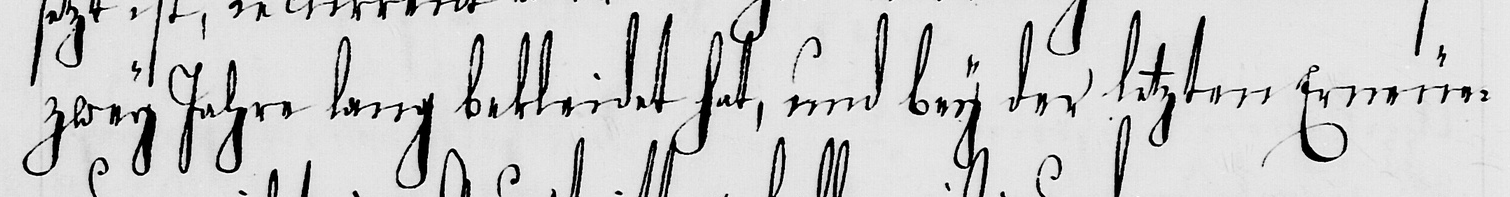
zwey Jahre lang bekleidet hat, und bey der letzten Erneue¬
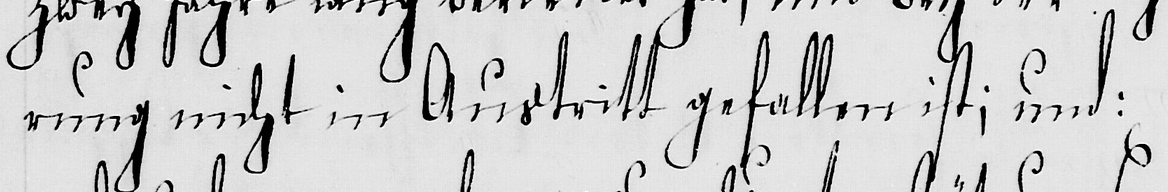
rung nicht in Austritt gefallen ist; und:
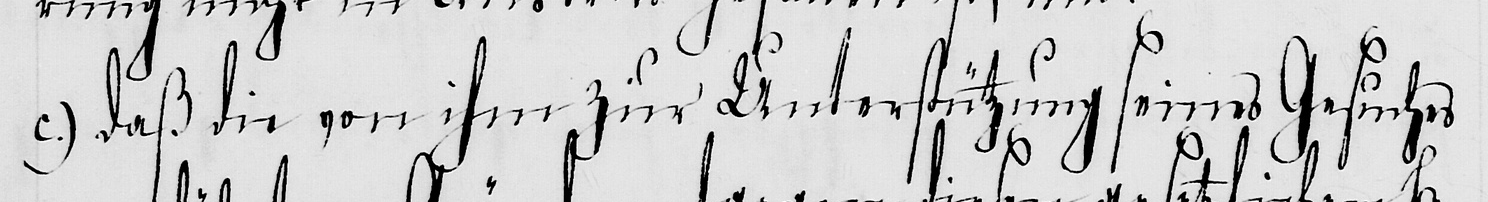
c.) daß die von ihm zur Unterstützung seines Gesuches
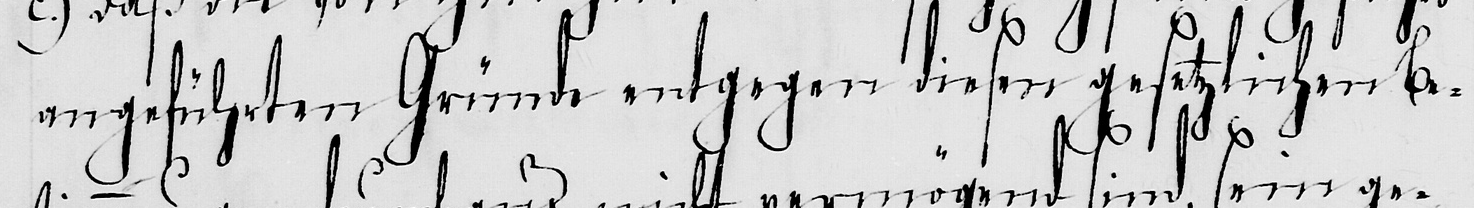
angeführten Gründe entgegen diesen gesetzlichen Be¬
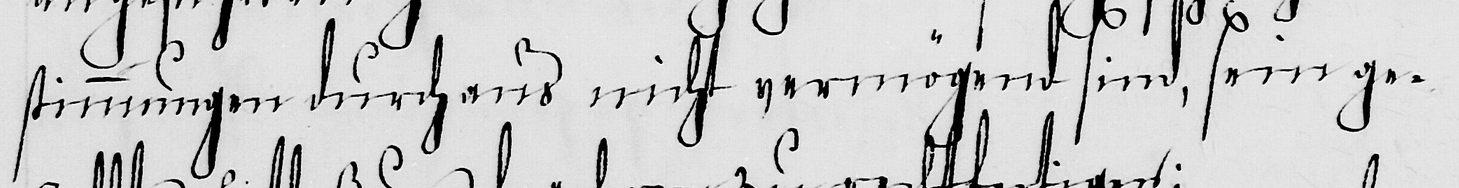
stimmungen durchaus nicht vermögend sind, sein ge¬
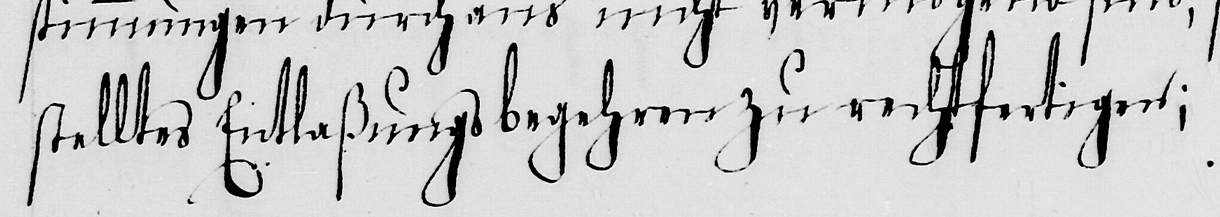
selltes Entlaßungsbegehren zu rechtfertigen;
